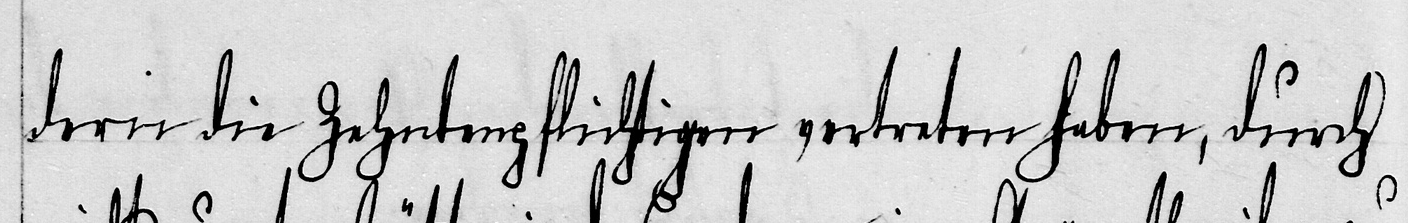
dern die Zehntenpflichtigen vertreten haben, durch
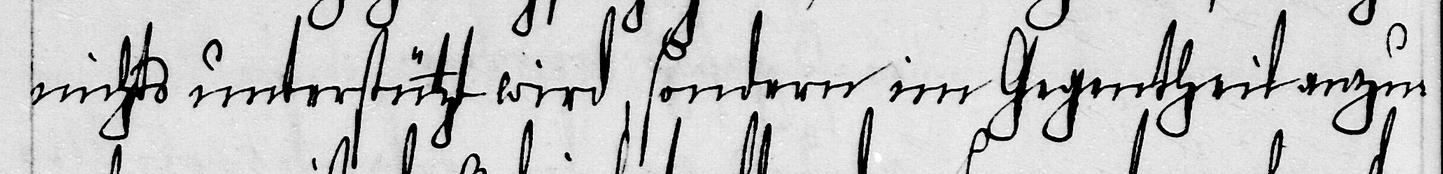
nichts unterstützt wird, sondern im Gegentheil anzu¬
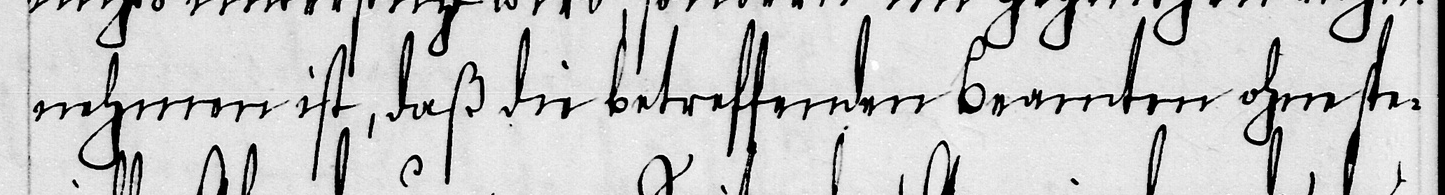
nehmen ist, daß die betreffenden Beamten ohne spe¬
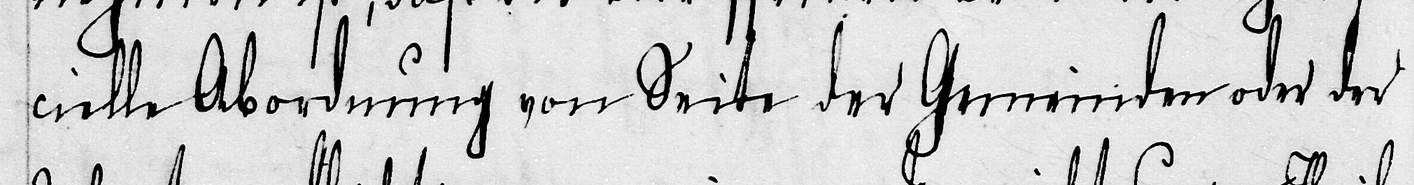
cielle Abordnung von Seite der Gemeinden oder der
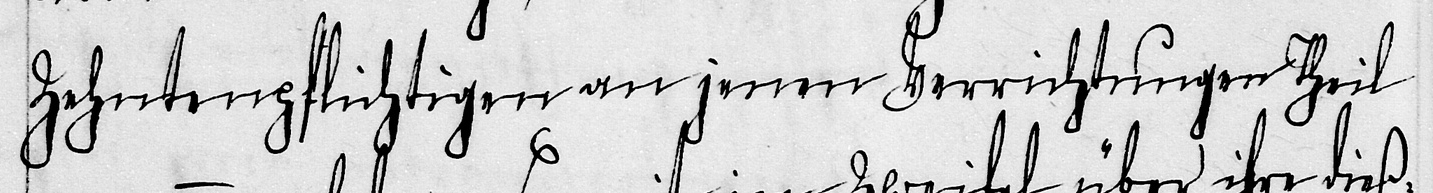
Zehntenpflichtigen an jenen Verrichtungen Theil
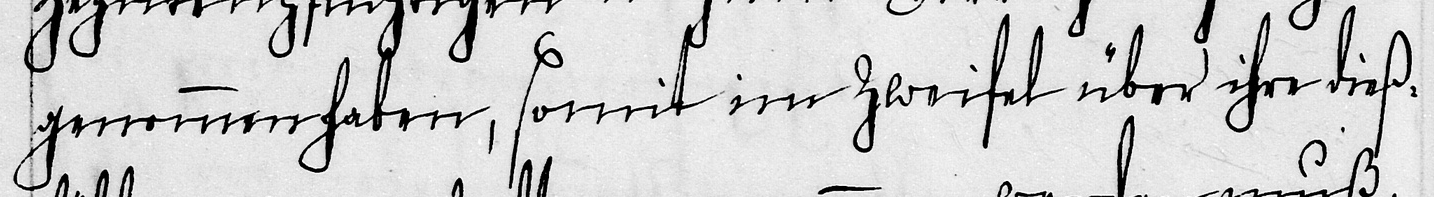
genommen haben, somit im Zweifel über ihre dieß¬
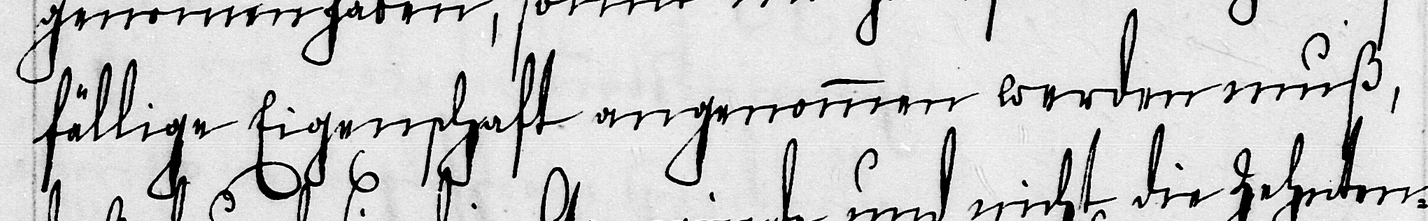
fällige Eigenschaft angenommen werden muß,
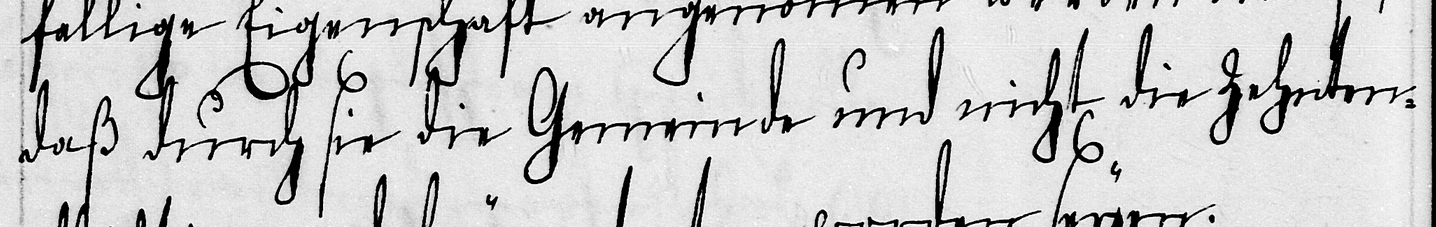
daß durch sie die Gemeinde und nicht die Zehnten¬
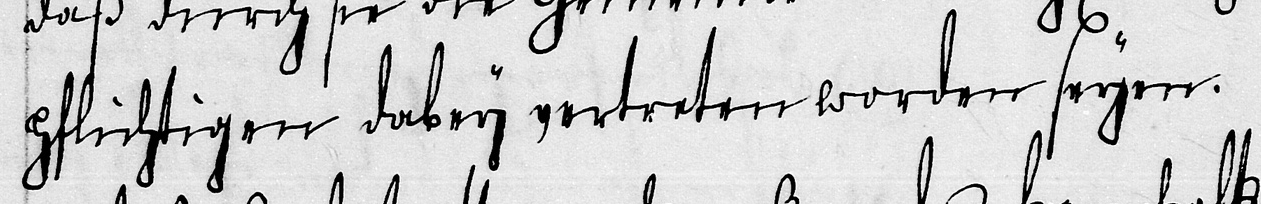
pflichtigen dabey vertreten worden seyen.
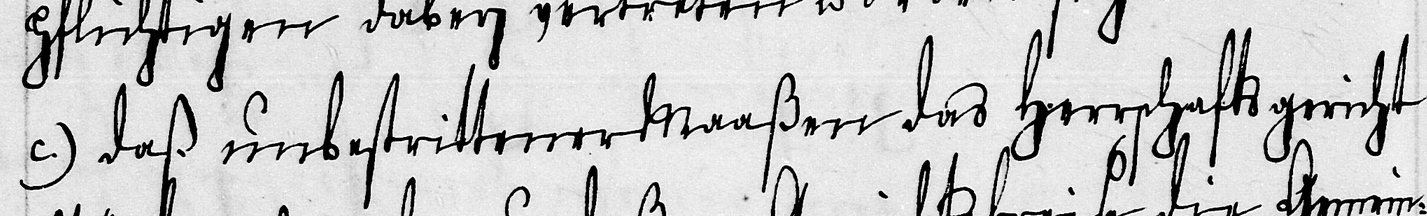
c.) Daß unbestrittener Maaßen das Herrschaftsgericht
